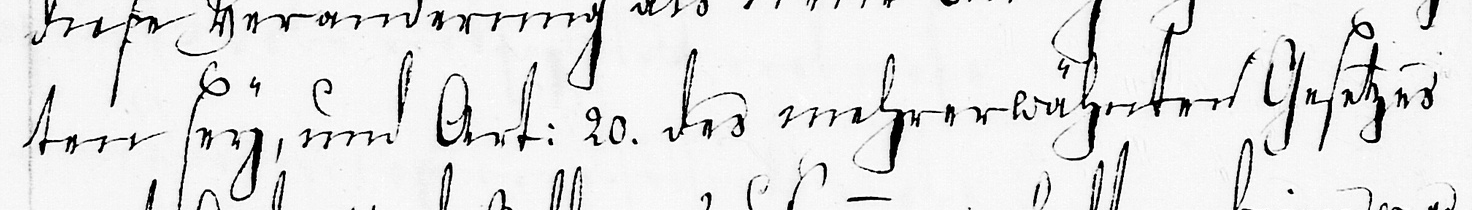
ten sey, und Art: 20. des mehrerwähnten Gesetzes
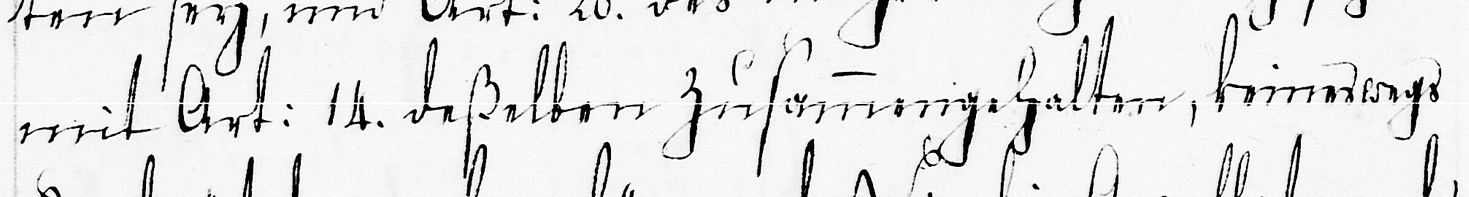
mit Art: 14. deßelben zusammengehalten, keineswegs
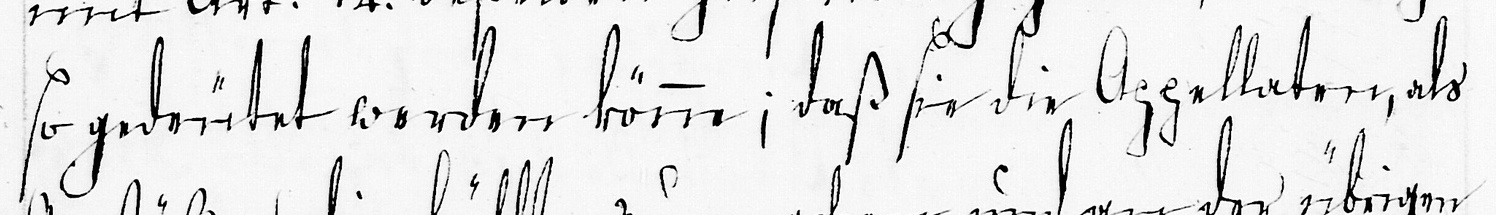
so gedeutet werden könne; daß sie die Appellaten, als
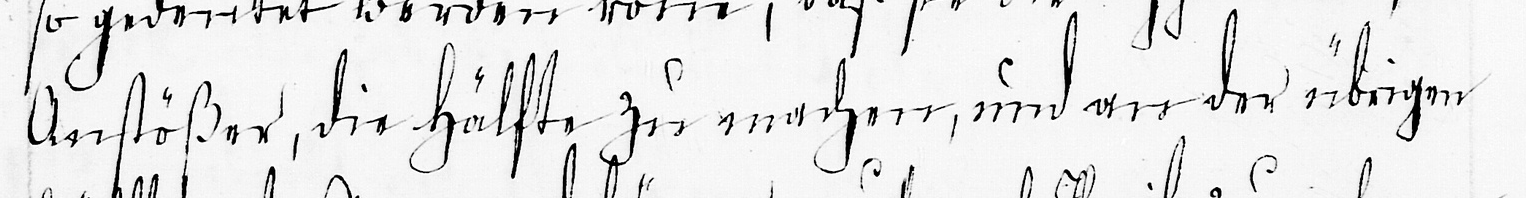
Anstößer, die Hälfte zu machen, und an der übrigen
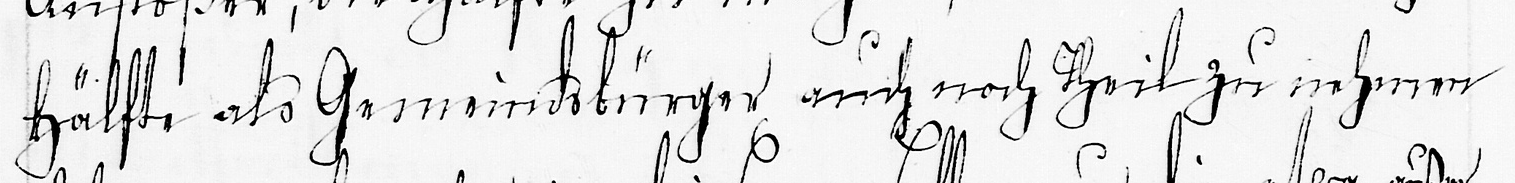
Hälfte als Gemeindsbürger auch noch Theil zu nehmen
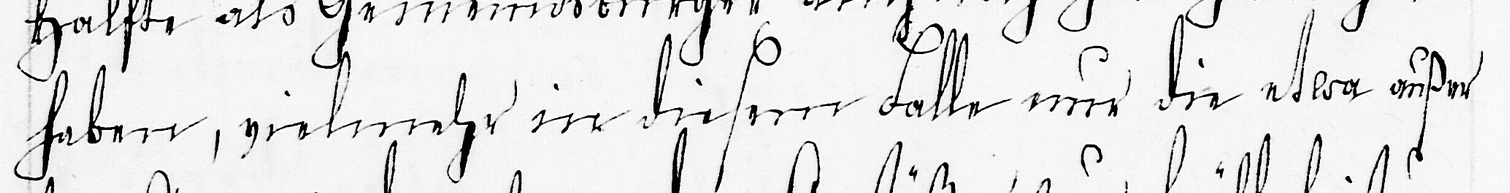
haben, vielmehr in diesem Falle nur die etwa außer
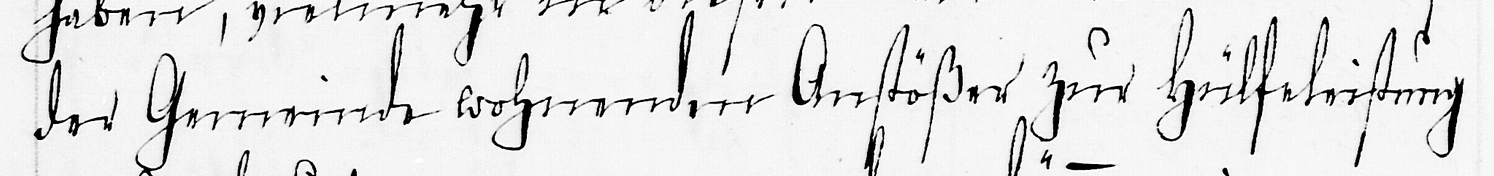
der Gemeinde wohnenden Anstößer zur Hülfeleistung
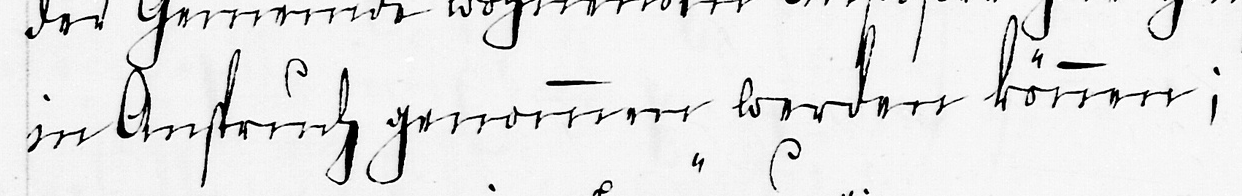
in Anspruch genommen werden können;
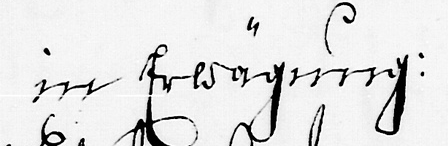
in Erwägung:
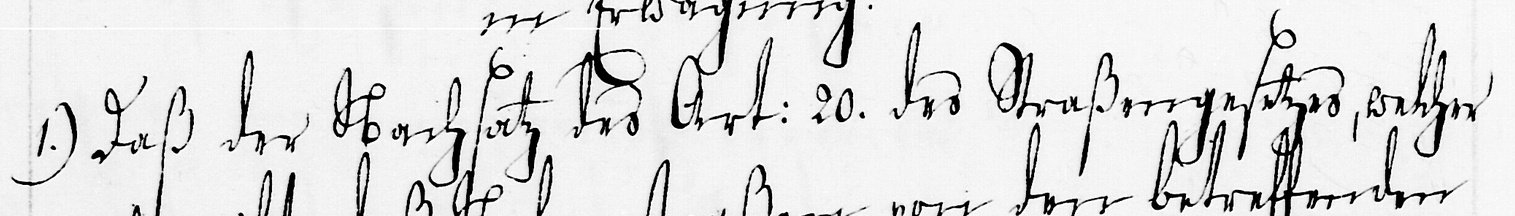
1.) Daß der Nachsatz des Art: 20. des Straßengesetzes, welch¬
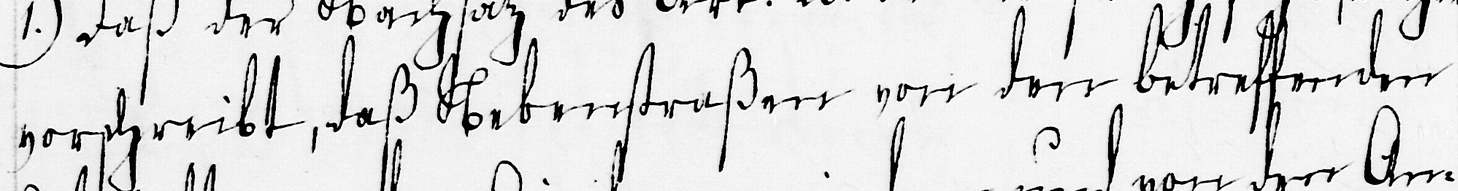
vorschreibt, daß Nebenstraßen von den betreffenden
